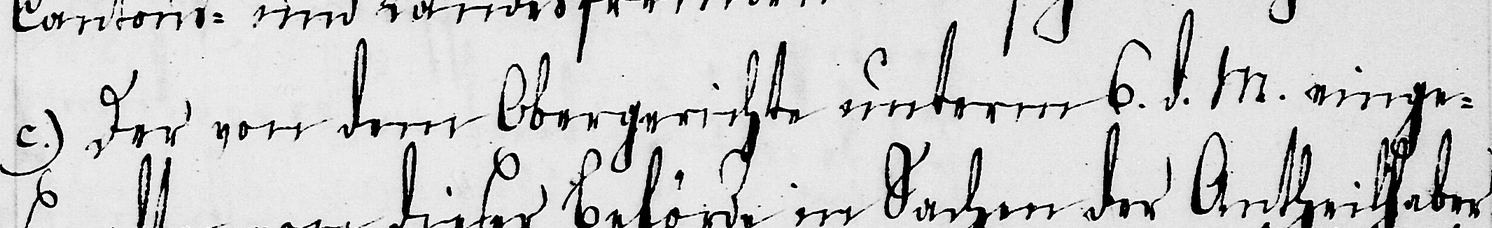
c.) Der von dem Obergerichte unterm 6. d. M. einge¬
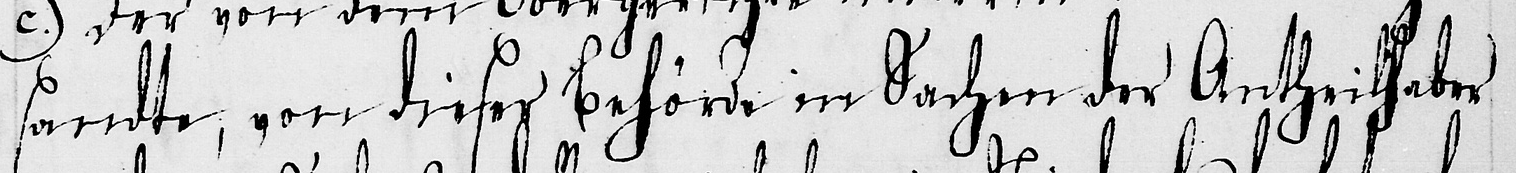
sandte, von dieser Behörde in Sachen der Antheilhaber
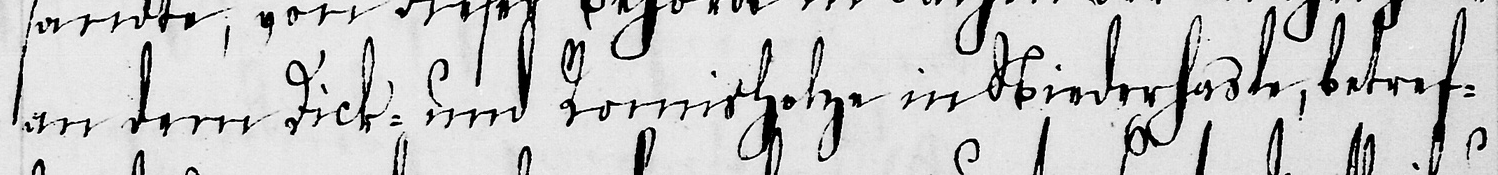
an dem Dick- und Romisholze in Niederhasle, betref¬
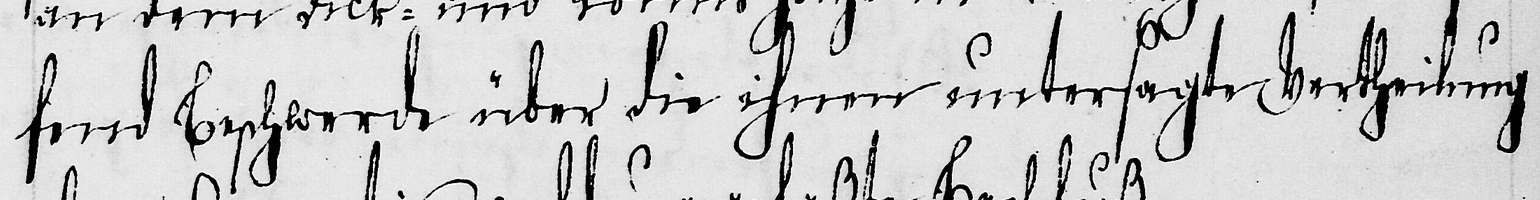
fend Beschwerde über die ihnen untersagte Vertheilung
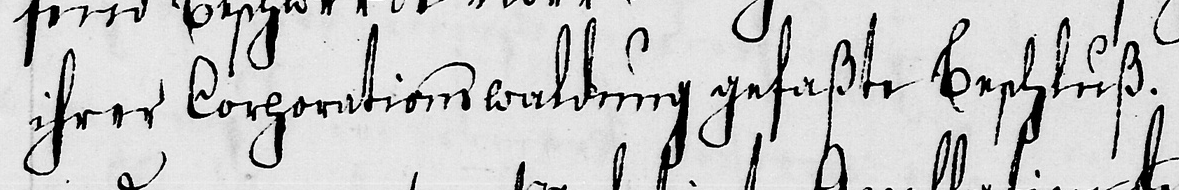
ihrer Corporationswaldung gefaßte Beschluß.
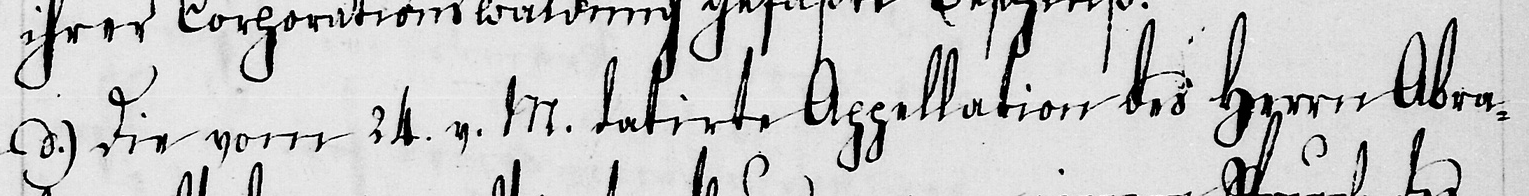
d.) Die vom 24 v. M. datirte Appellation des Herrn Abra¬
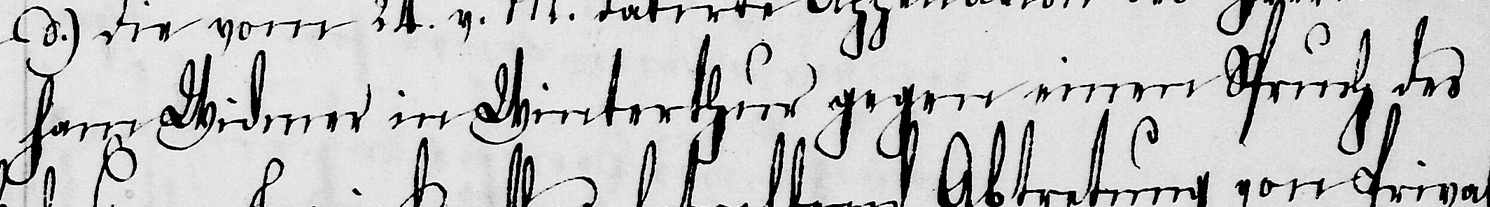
ham Widmer in Winterthur gegen einen Spruch des
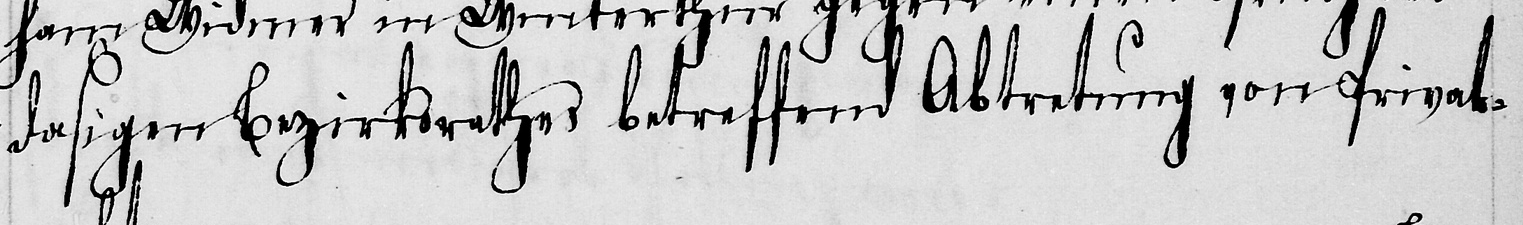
dasigen Bezirksrathes betreffend Abtretung von Privat¬
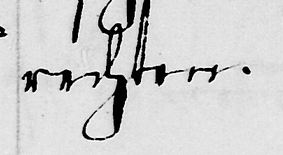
rechten.
